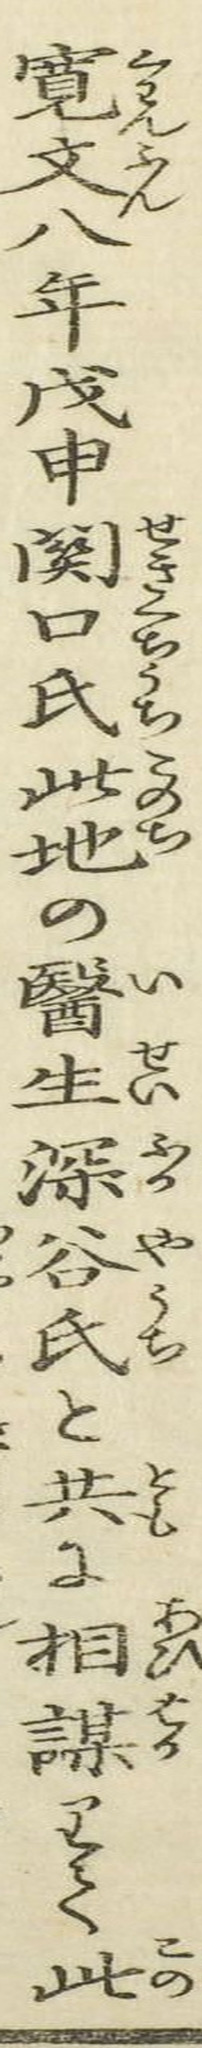寛文八年戊申関口氏此地の医生深谷氏と共に相謀りて此
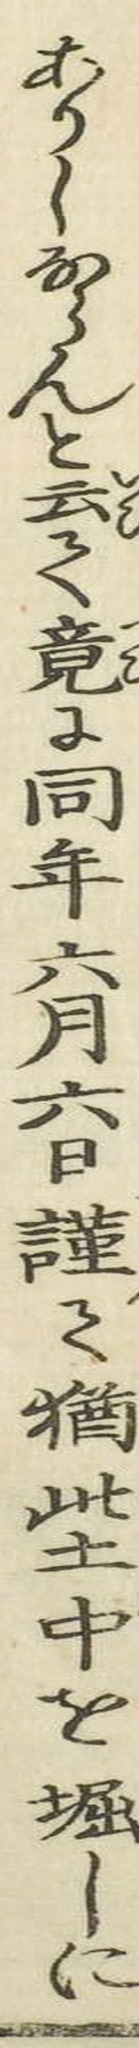ありしならんと云て竟に同年六月六日謹て猶此土中を堀しに
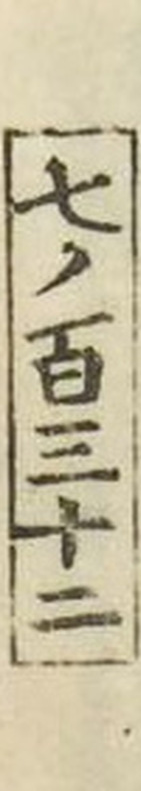七ノ百三十二
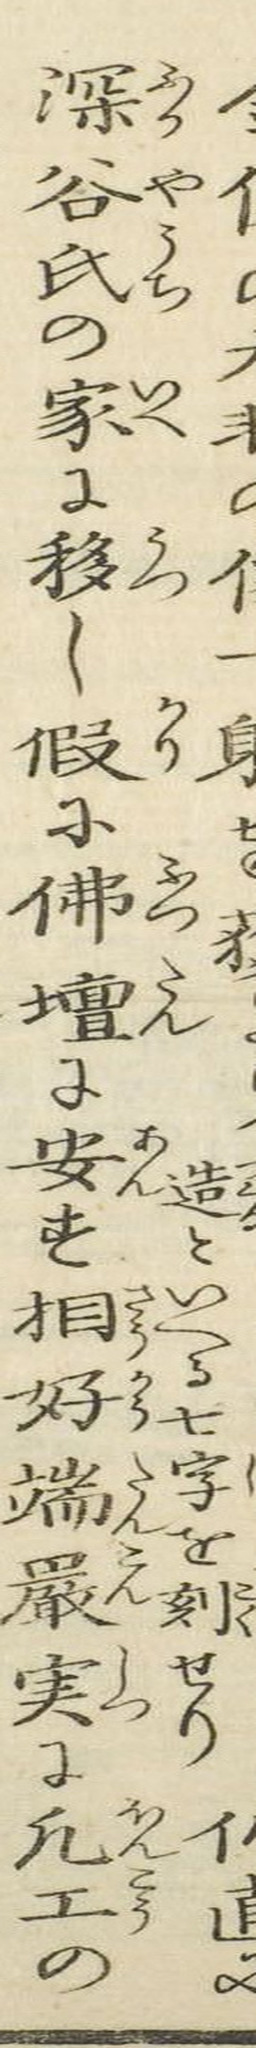深谷氏の家に移し假に仏壇に安す相好端厳実に凡工の
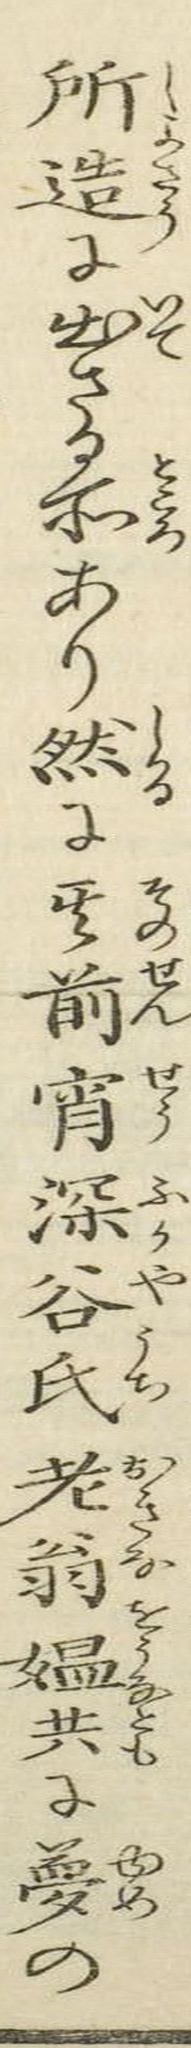所造に出たる所あり然に其前宵深谷氏老翁媼共に夢の
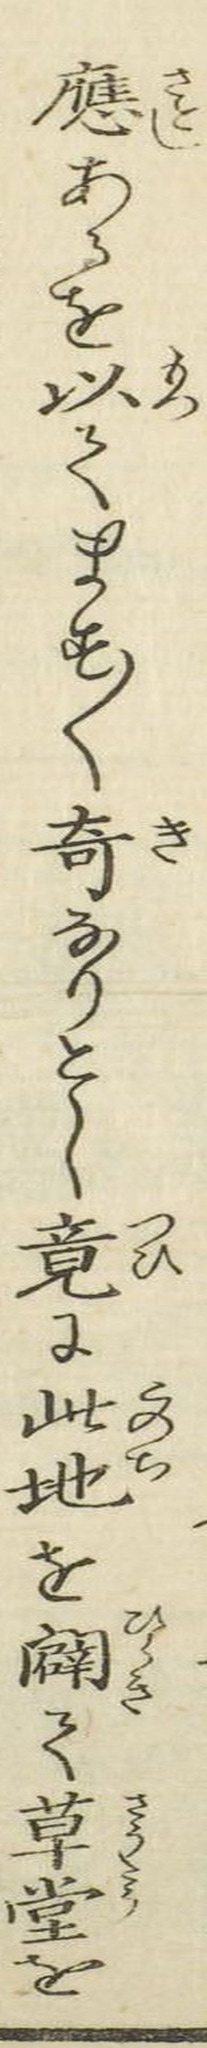応あるを以てます〳〵奇なりとして竟に此地を闢て草堂を
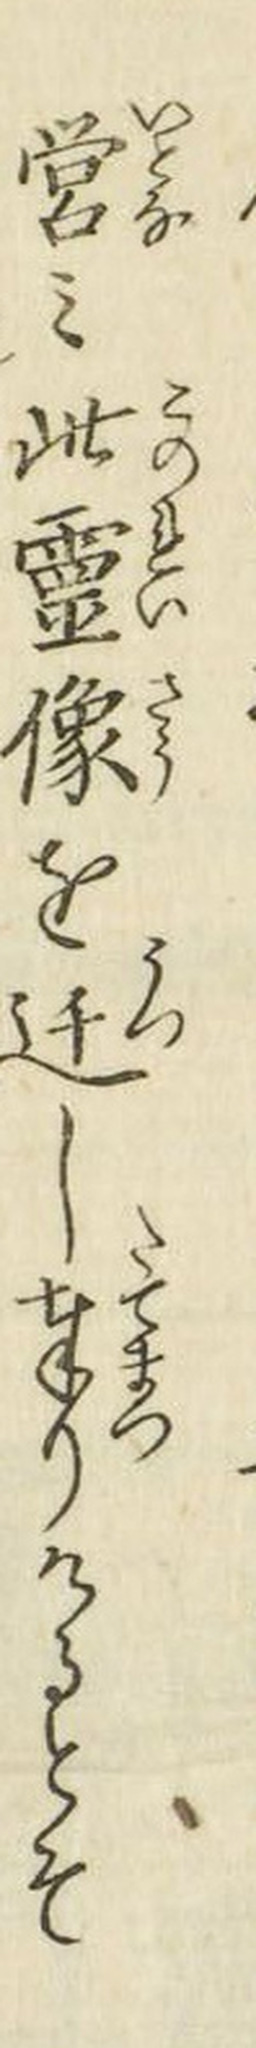営み此霊像を迁し奉りけるとそ
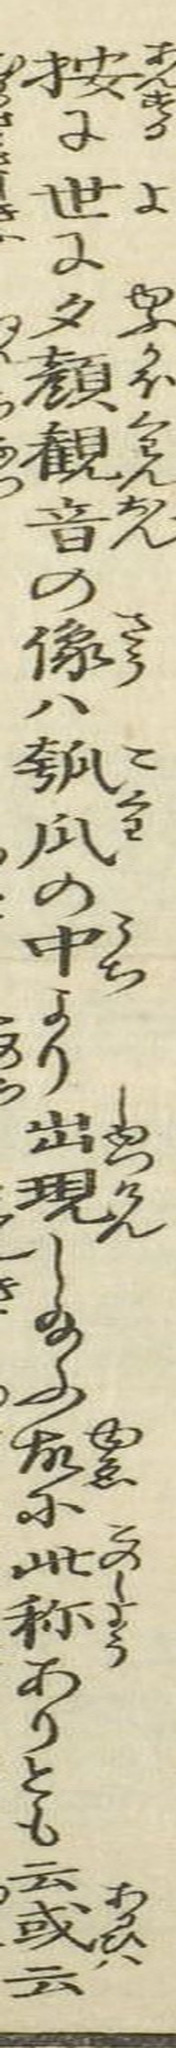按に世に夕顔観音の像は瓠瓜の中より出現し給ふ故に此称ありとも云或云
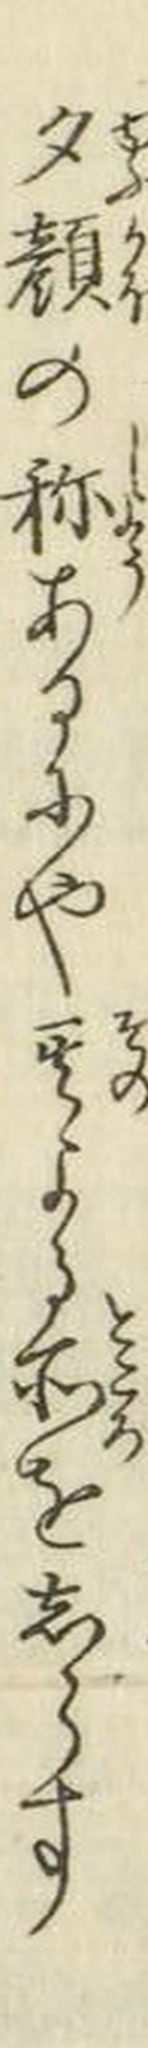夕顔の称あるにや其よる所をしらす
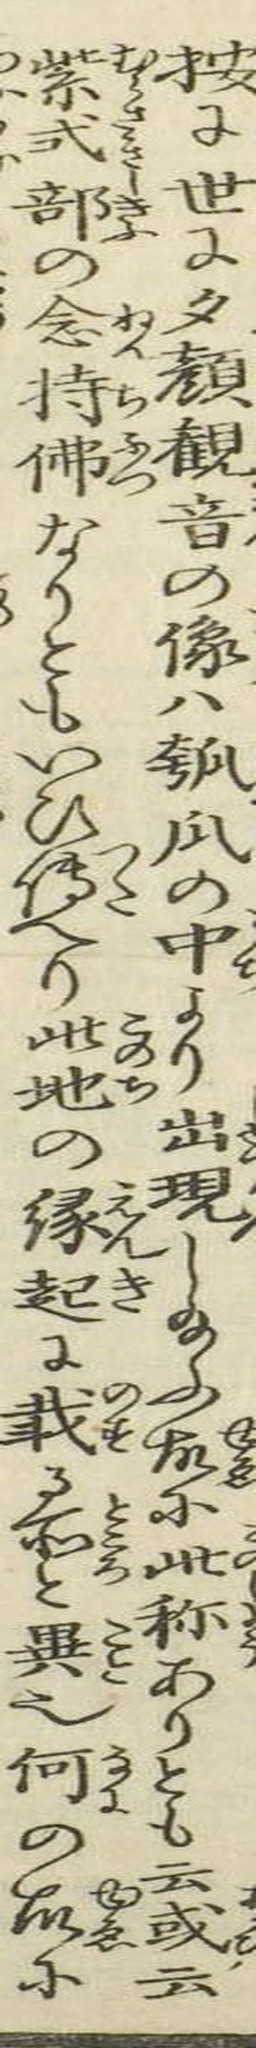紫式部の念持仏なりともいひ伝へり此地の縁起に載る所と異也何の故に
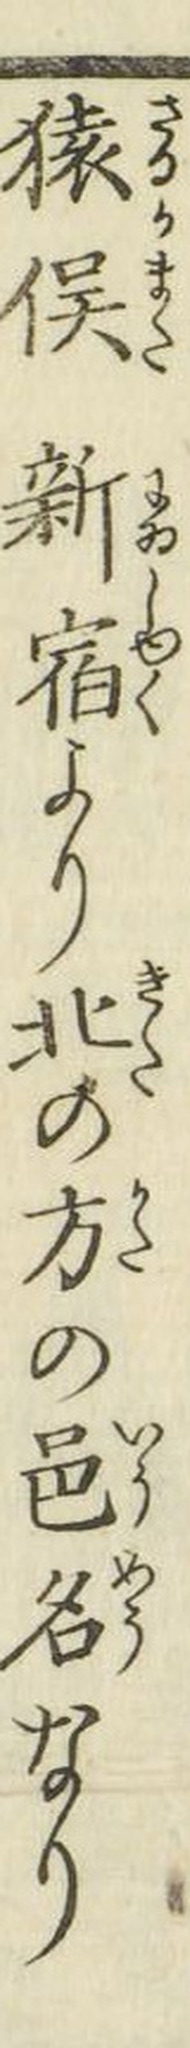猿俣新宿より北の方の邑名なり
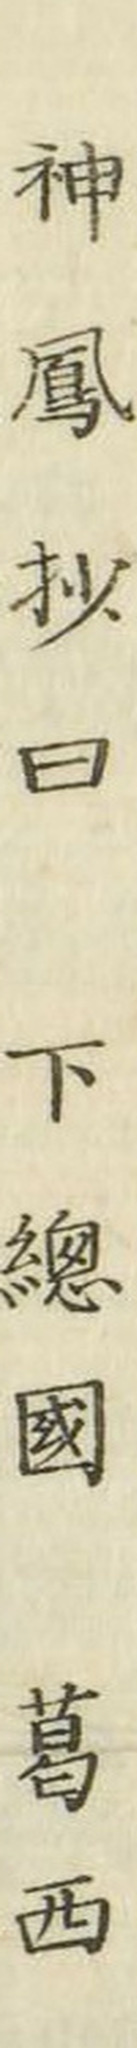神鳳抄曰下総国葛西
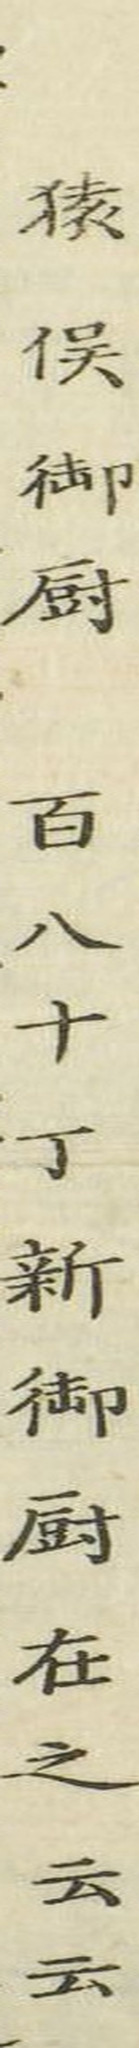猿俣御厨百八十丁新御厨在之云云
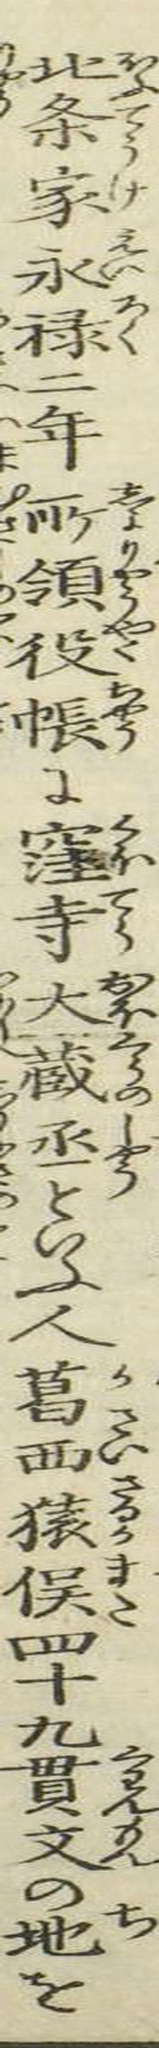北条家永禄二年所領役帳に窪寺大蔵丞といふ人葛西猿俣四十九貫文の地を
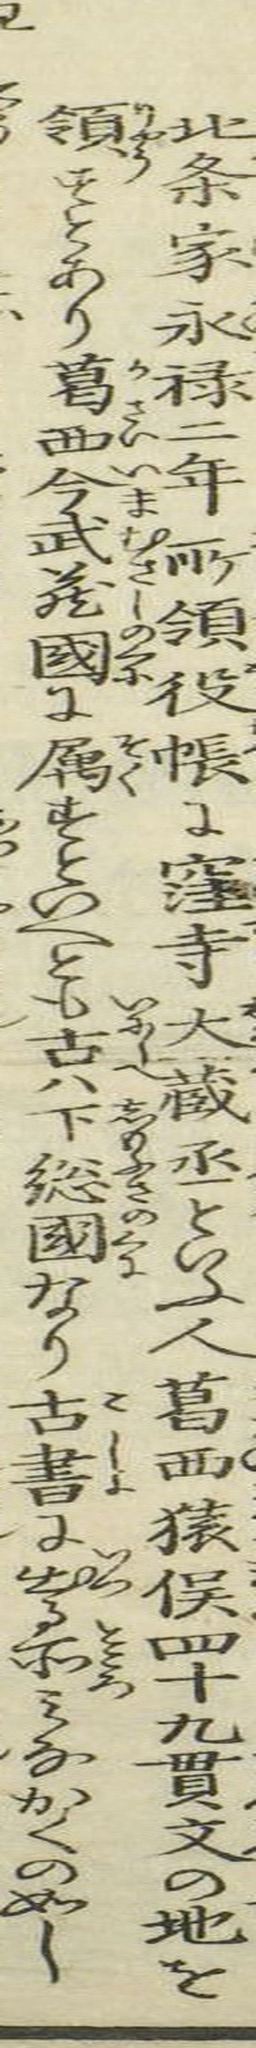領すとあり葛西今武蔵国に属すといへとも古は下総国なり古書に出る所みなかくの如し
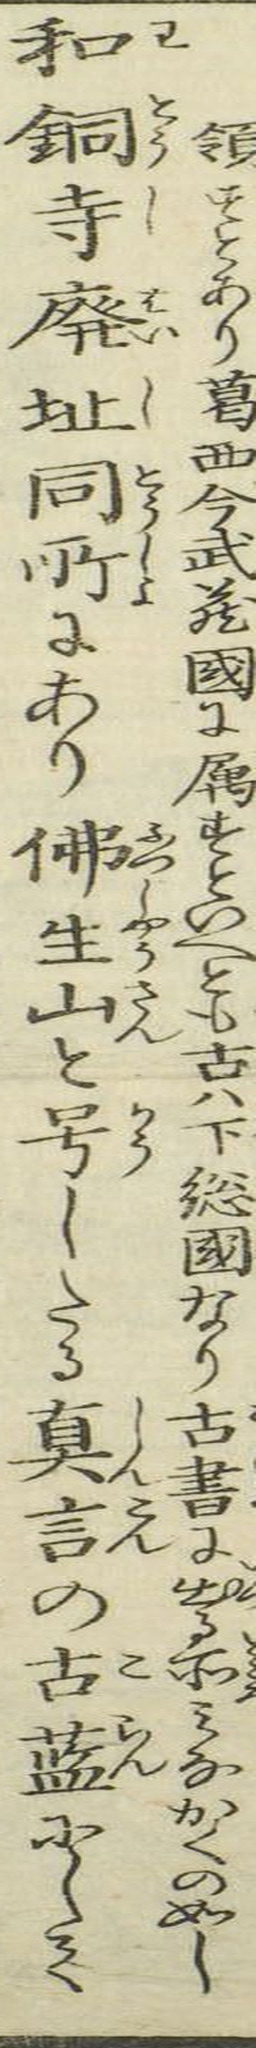和同寺廃址同所にあり仏生山と号したる真言の古藍にして
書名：江戸名所図会 20巻 巻之20
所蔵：東京学芸大学教育コンテンツアーカイブ
